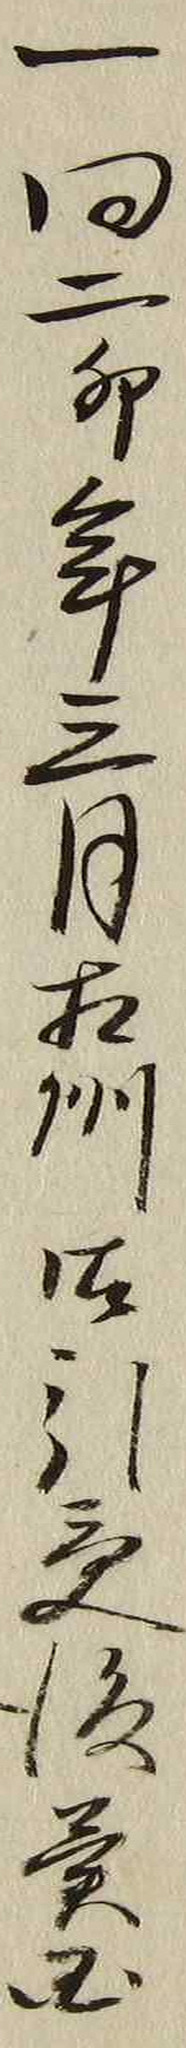一同二卯年三月相州御引受後異国
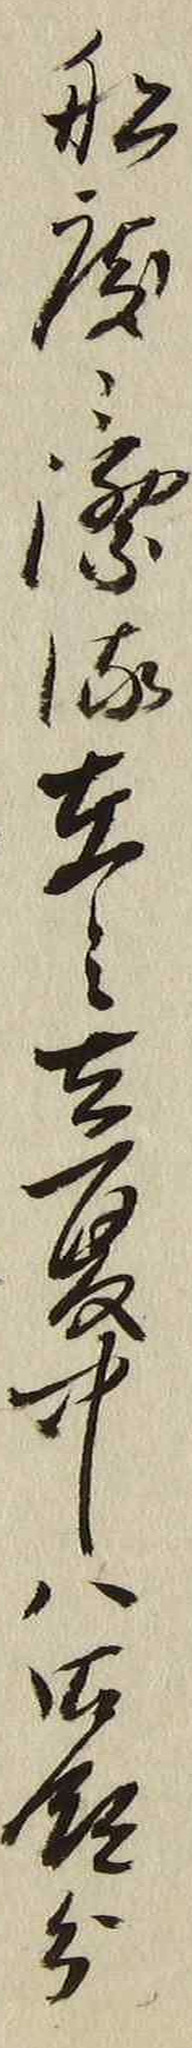船度々漂流在之去夏中ハ御領分
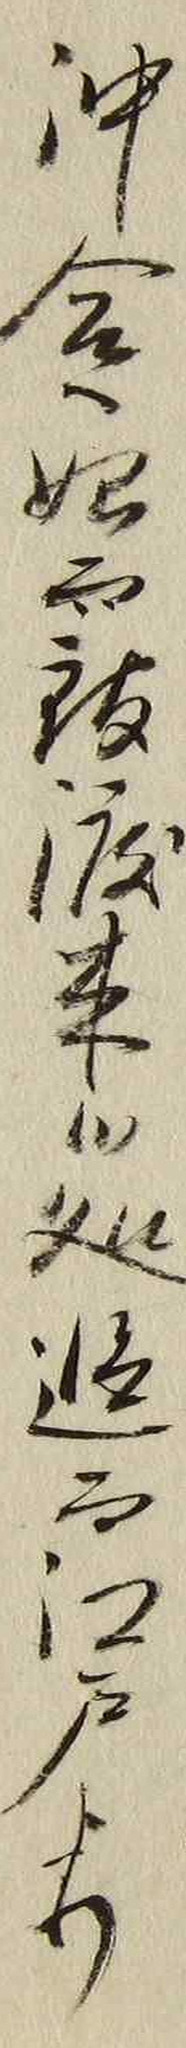沖合へ始而致渡来候処追而江戸より
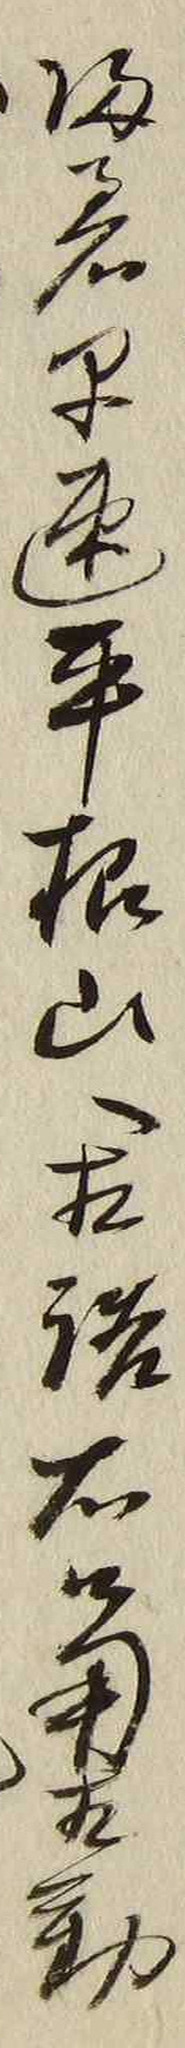帰着早速平根山へ相詰右御用相勤
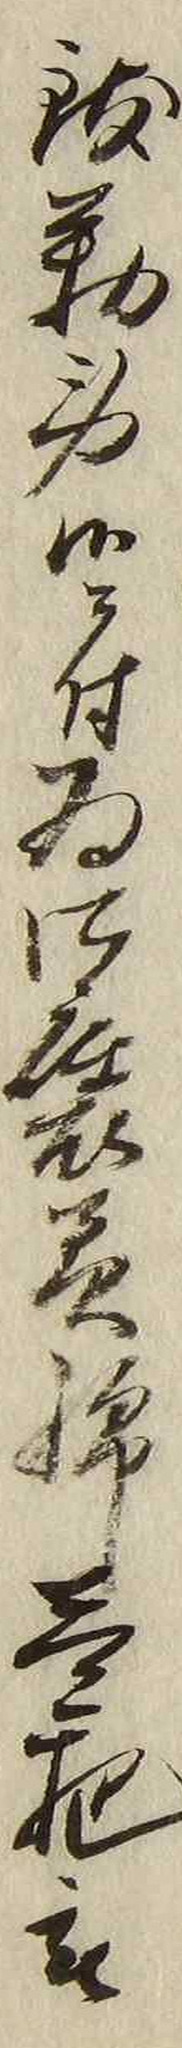致勤労候ニ付為御褒美綿壱把被

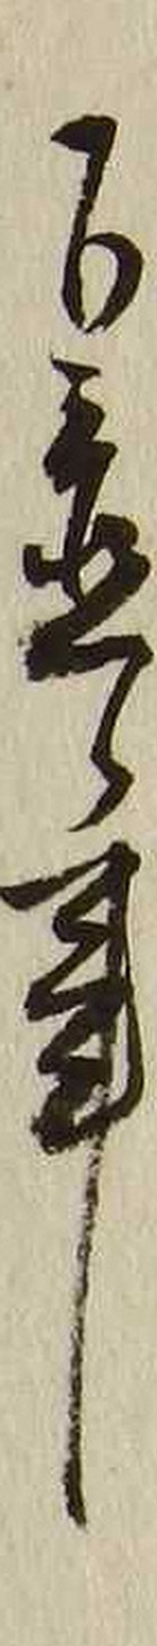下置候事
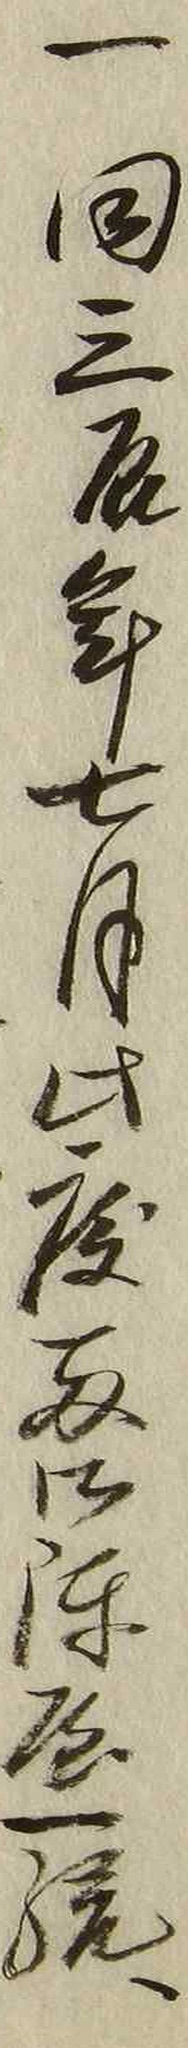一同三辰年七月此度両御陣屋一統へ
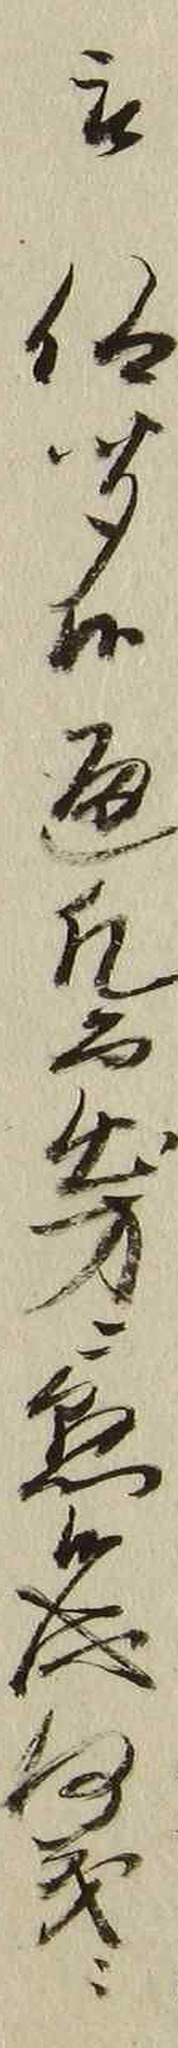被仰聞候通凡而出方ニ懸候儀何義ニ
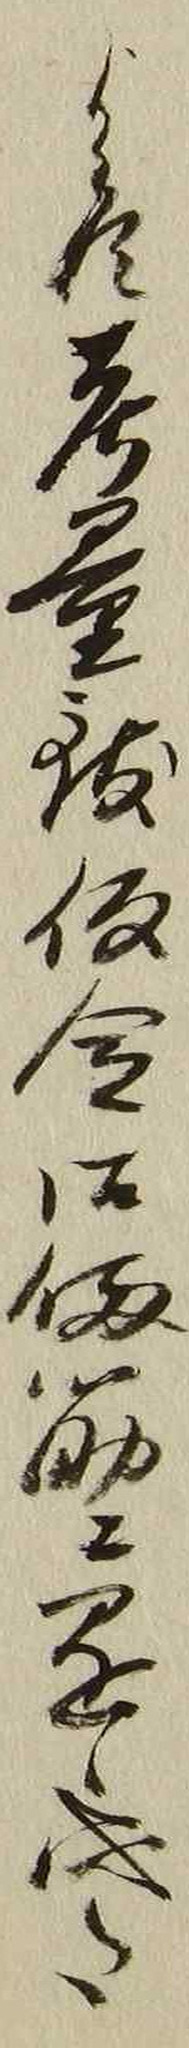よらす考量致仮令御備筋ニ懸候儀た
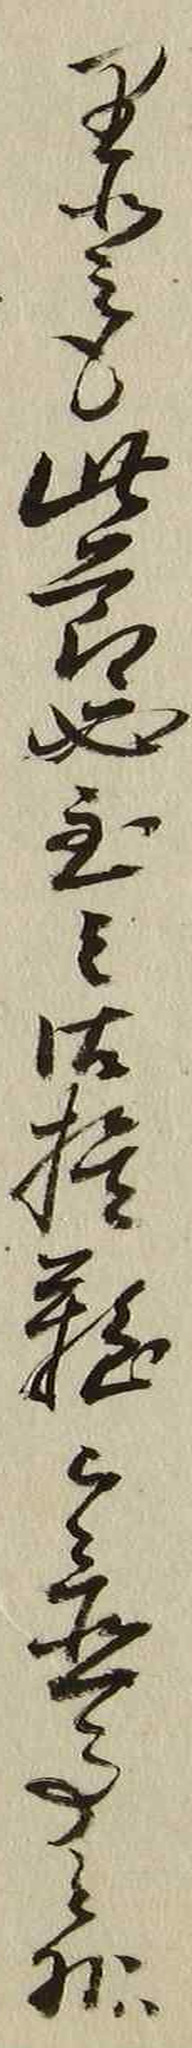りとも此節必至之御捨難被置候事之外ハ
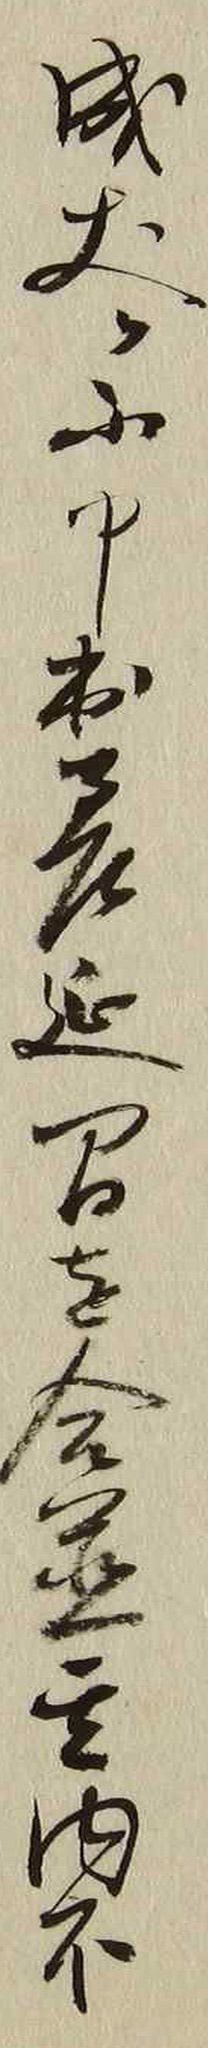成丈ケ不申出差延間を合置其内不
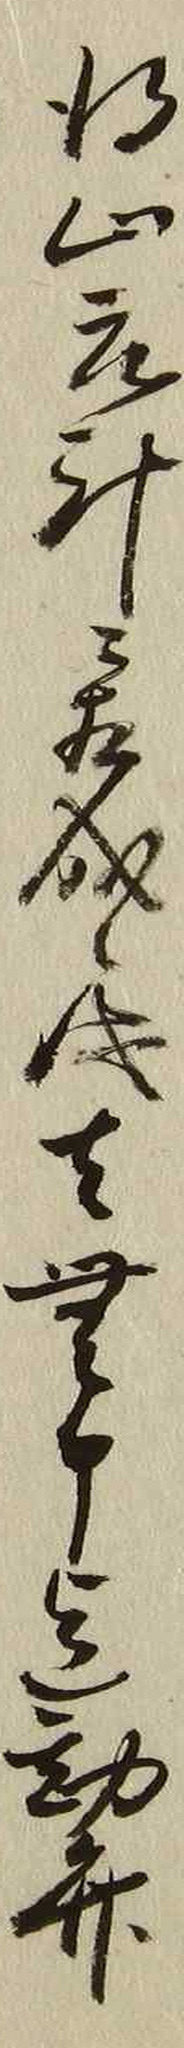得止取計ニ相成候儀は無申迄勘弁
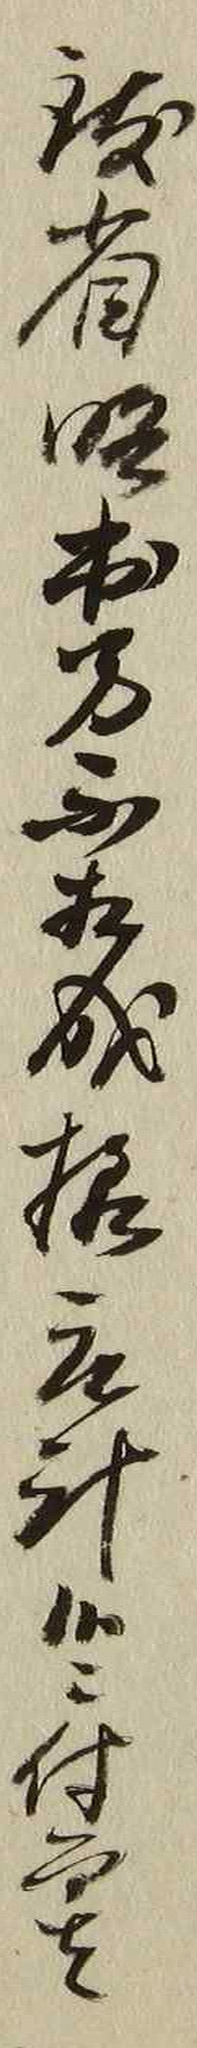致省略出方不相成様取計候ニ付而は
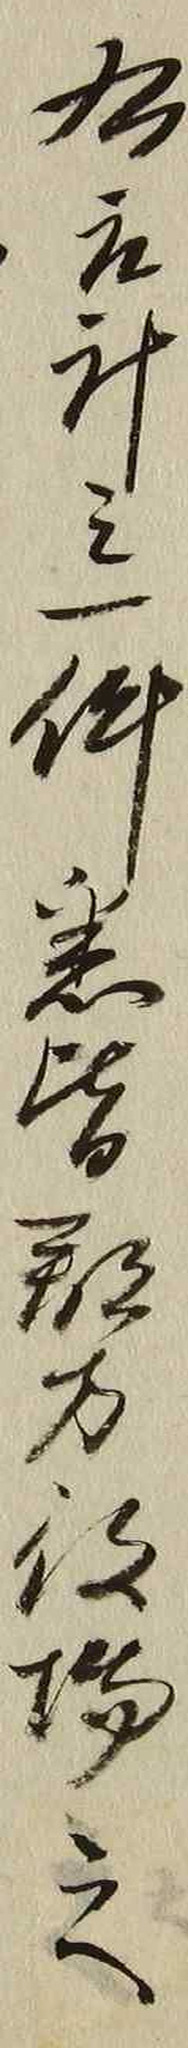右取計之一件悉皆郡方役場之
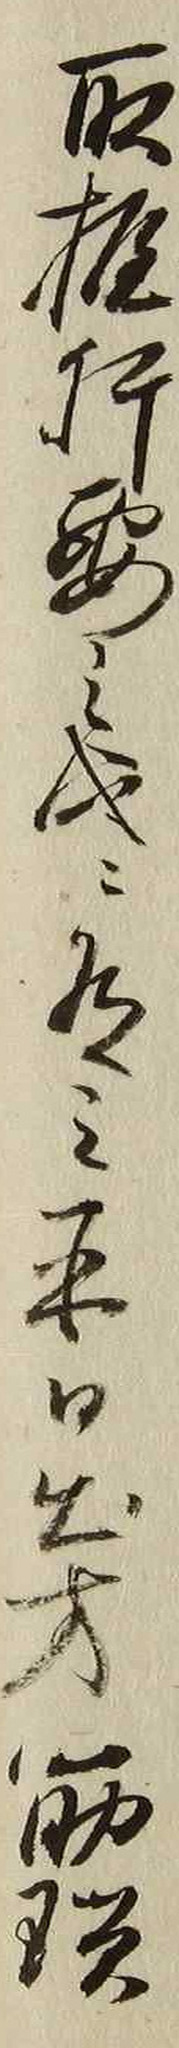取極肝要之儀ニ有之平日出方筋瑣
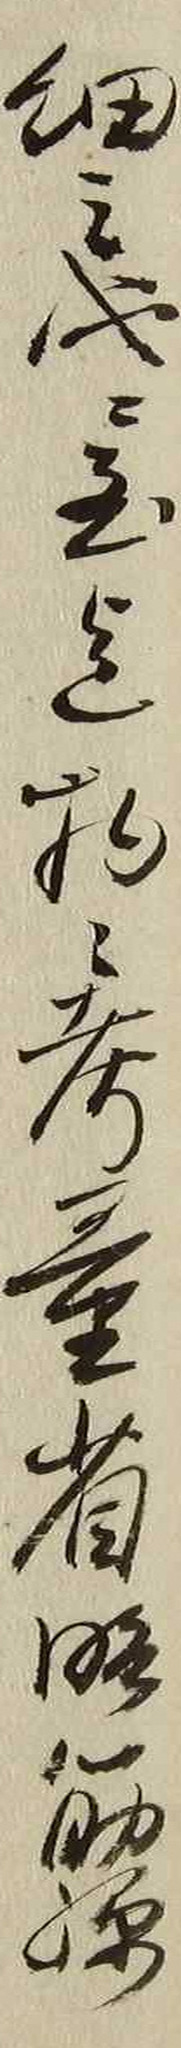細之儀ニ至迄物々考量省略筋綿
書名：諸士系譜　巻之352　す之部2
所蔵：会津若松市立会津図書館
